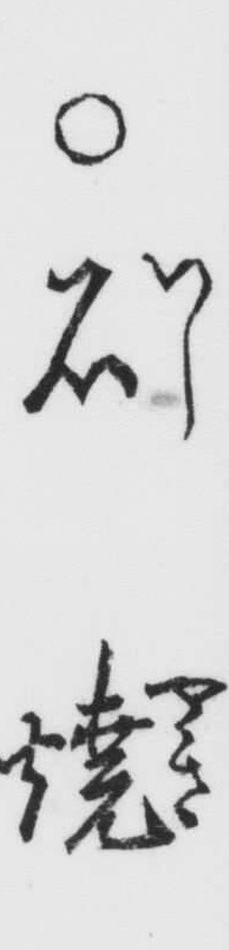○石焼
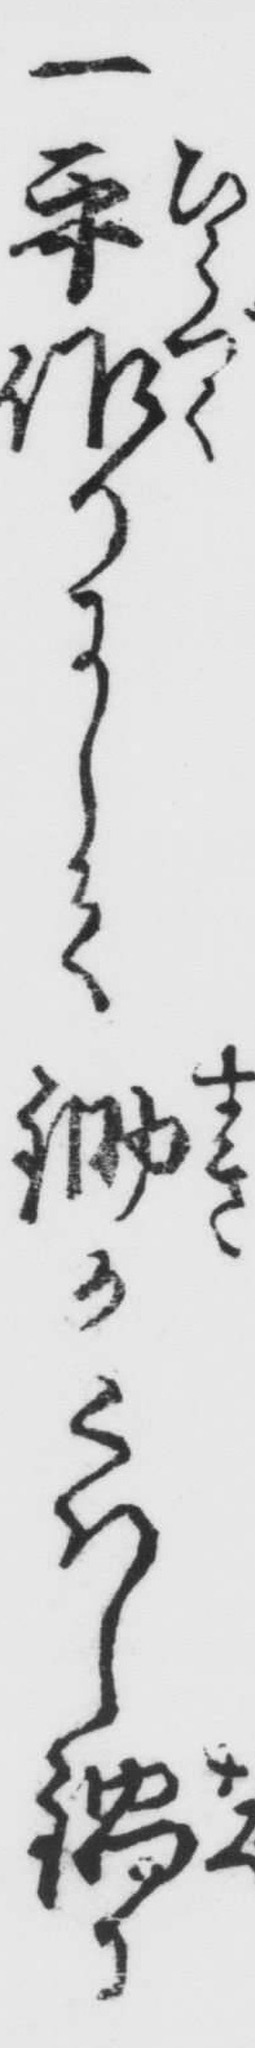一平作りにして鋤かくはし鍋か
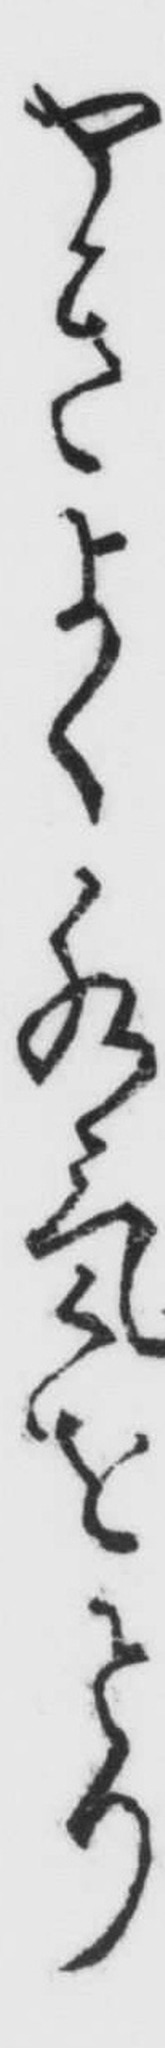やきよく水気をとり
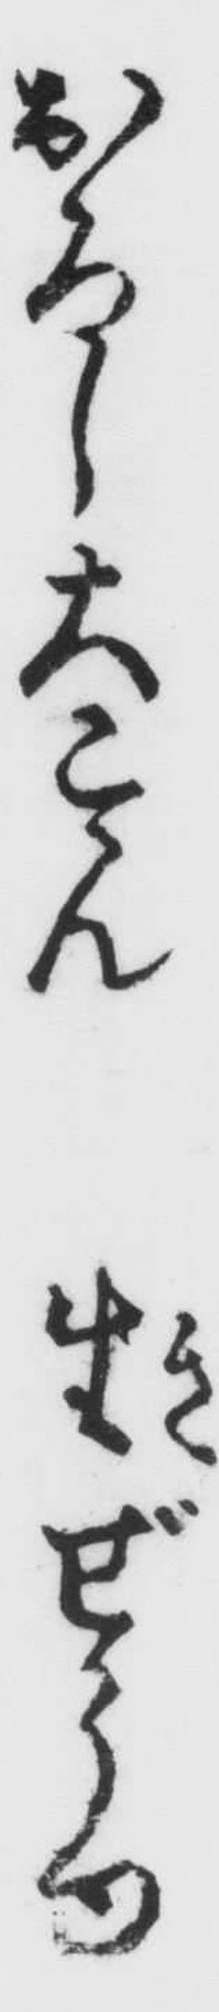おろし大こん生ぜうゆ
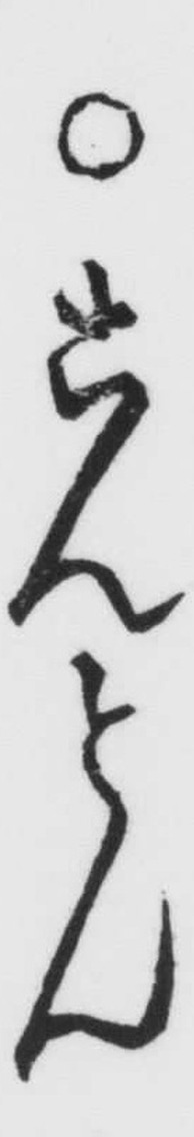○こんとん
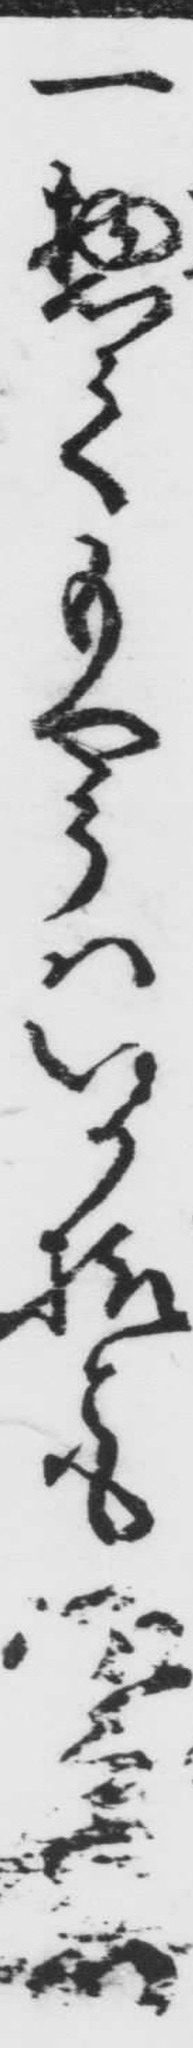一惣てもやうはいか様とも

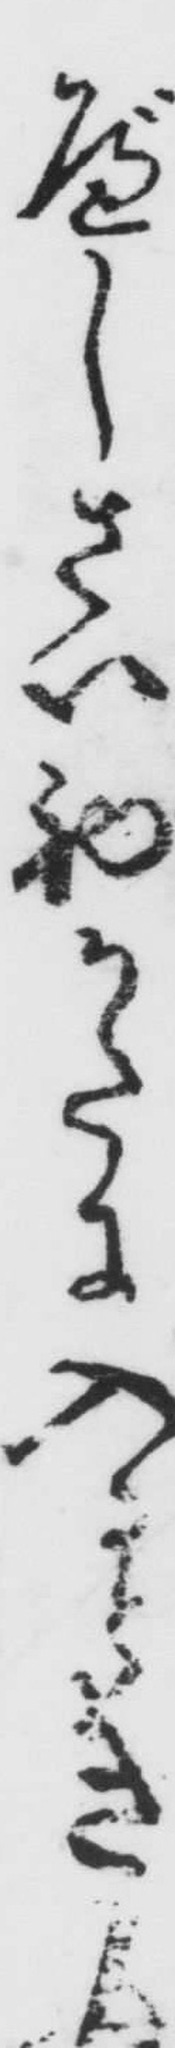べしさい初かたに入るとき
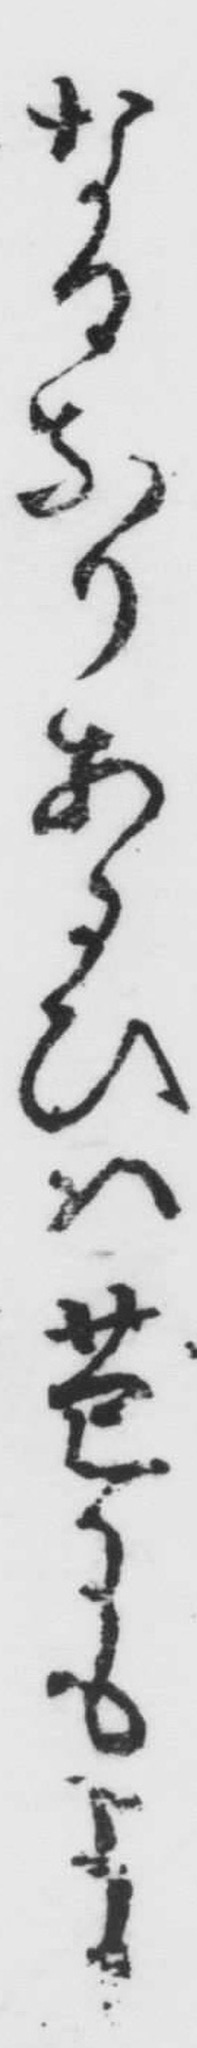なるなりあるひは苞にもよし
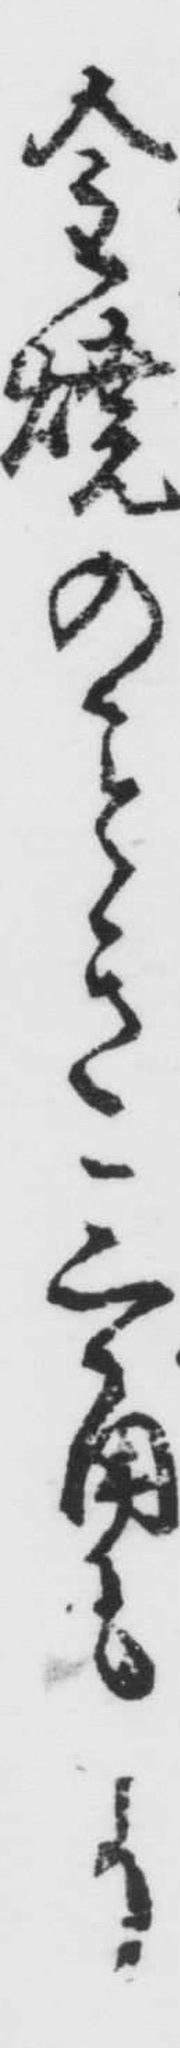金焼のことき三角もよし
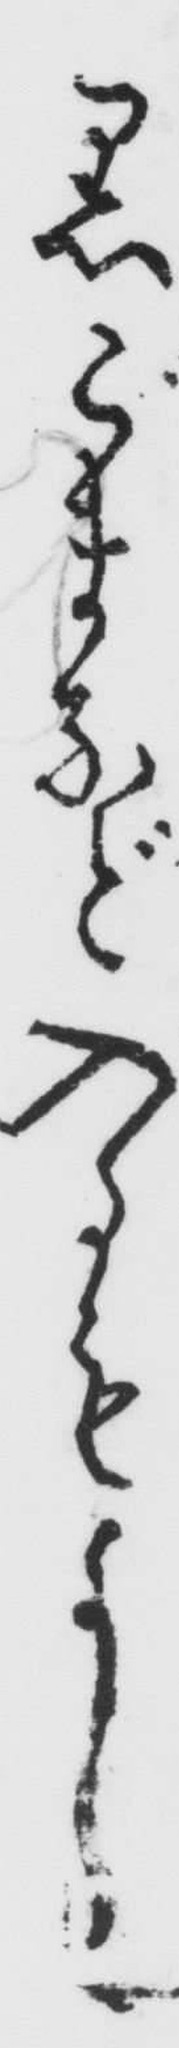黒ごまなど入るもよし
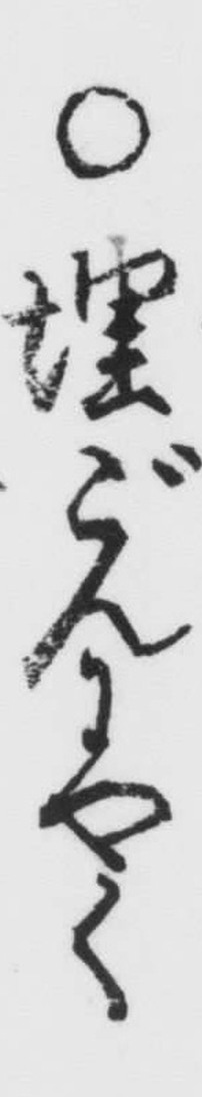○埋ごんにやく
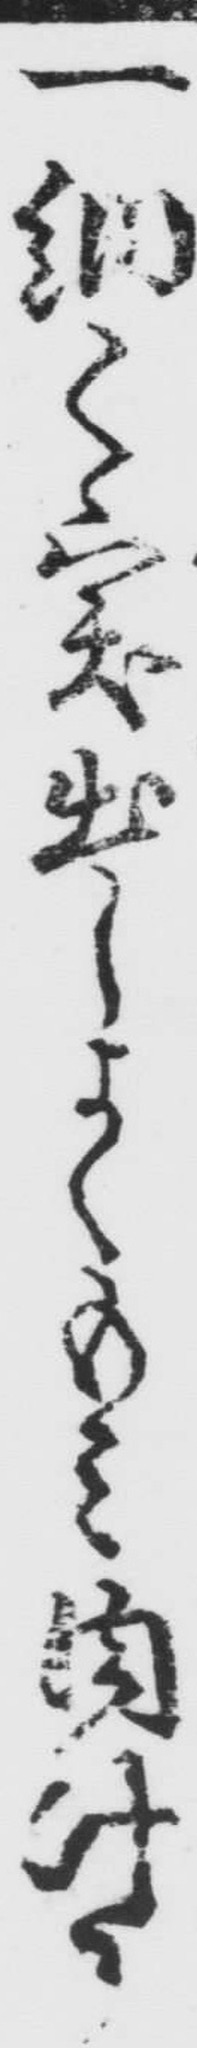一細く突出しよくもみ肉汁に
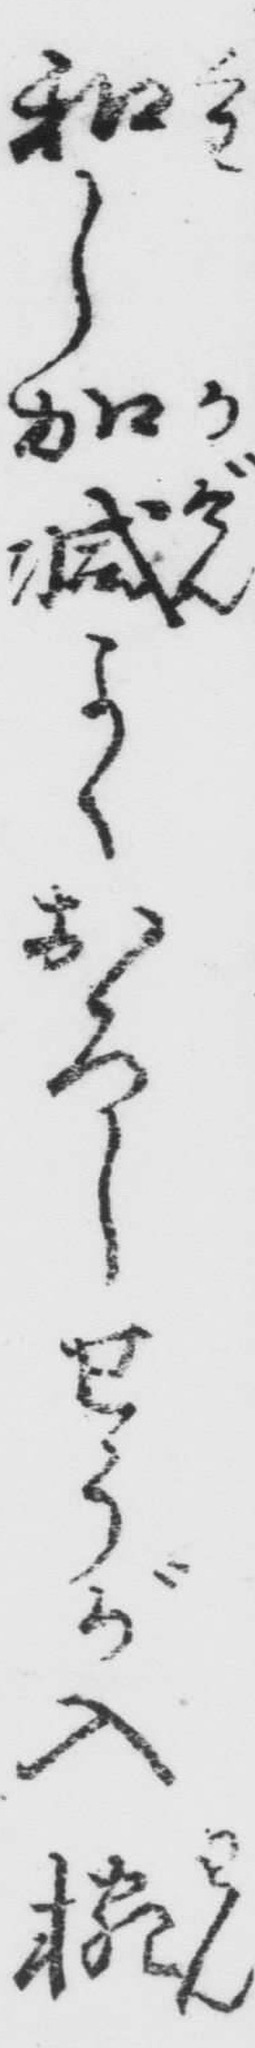和し加減よくおろしせうが入椀
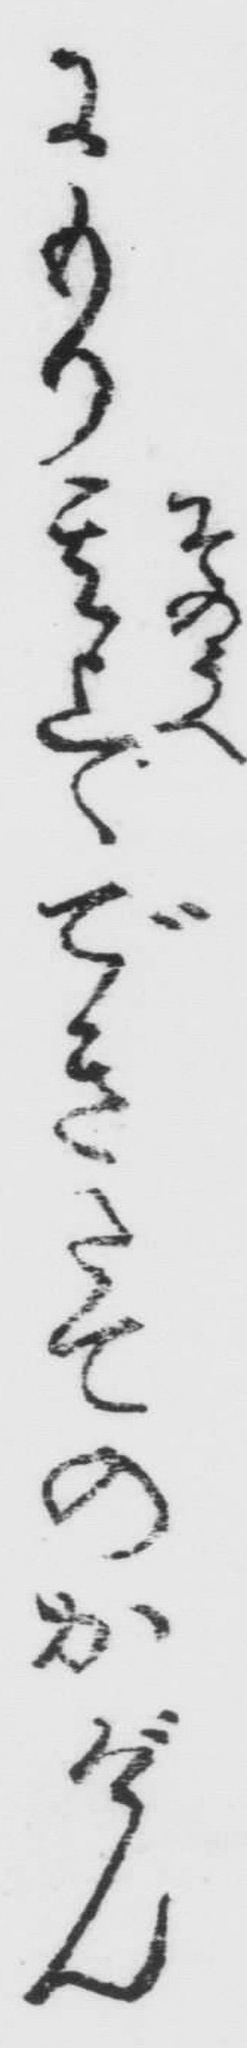にもり其上へできたてのかげん
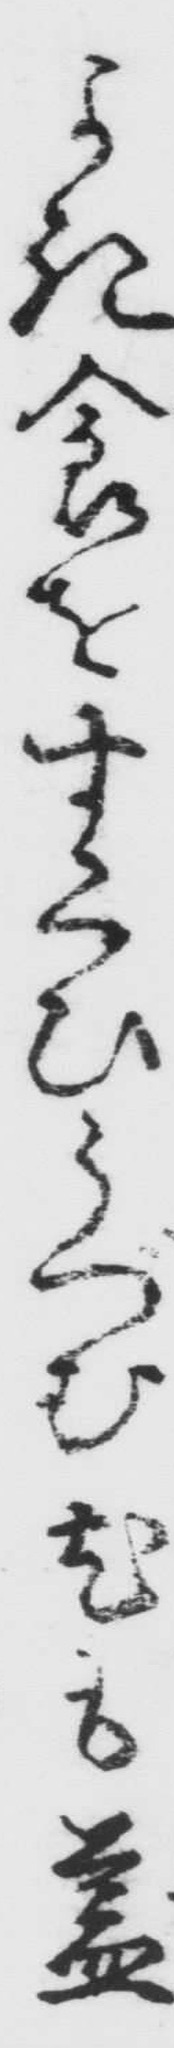よき食をすくひうづむ尤も蓋
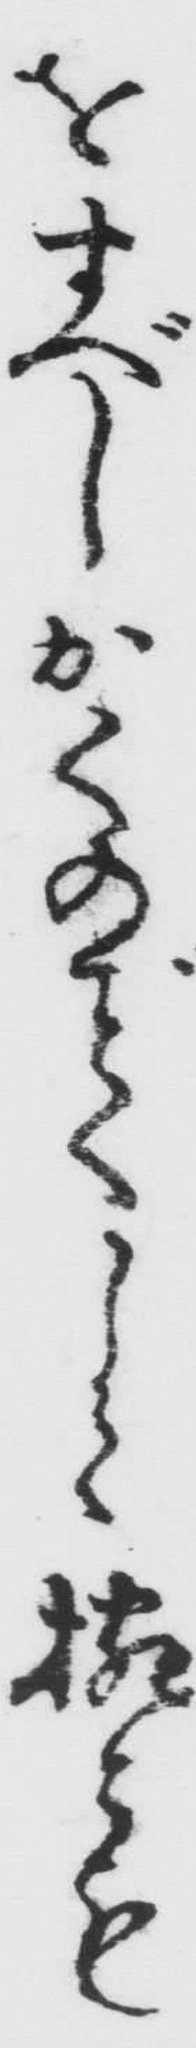をすべしかくのごとくして椀とも
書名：蒟蒻百珍
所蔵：大阪府立大学学術情報センター 国文学研究資料館
